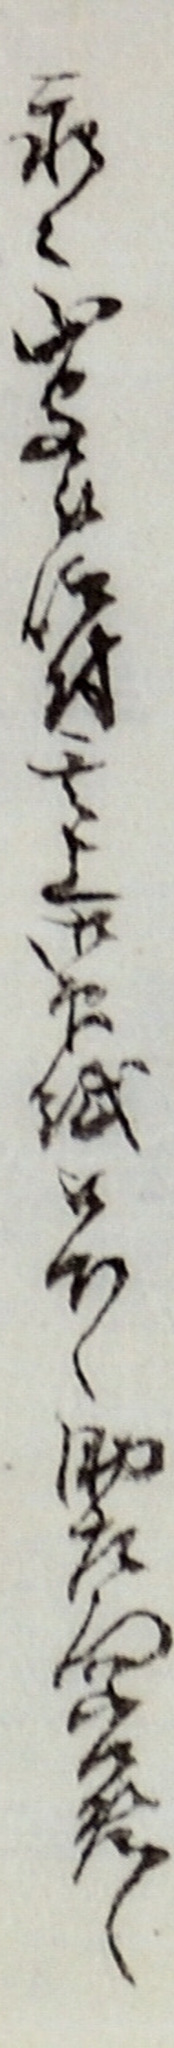永々山守被仰付其上御印紙被下候助左衛門差免候
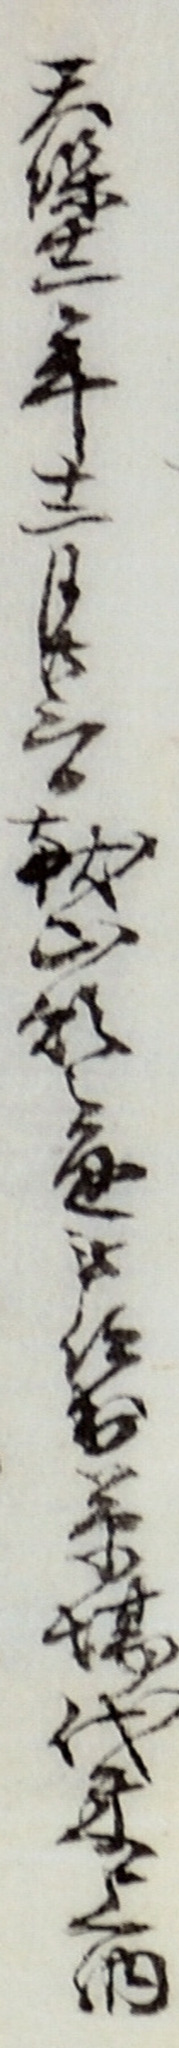天保十二年十二月廿三日献山願之通被仰出草場代米上納

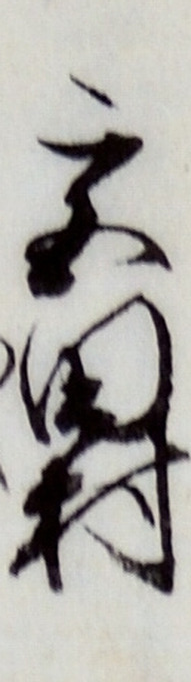宮田村
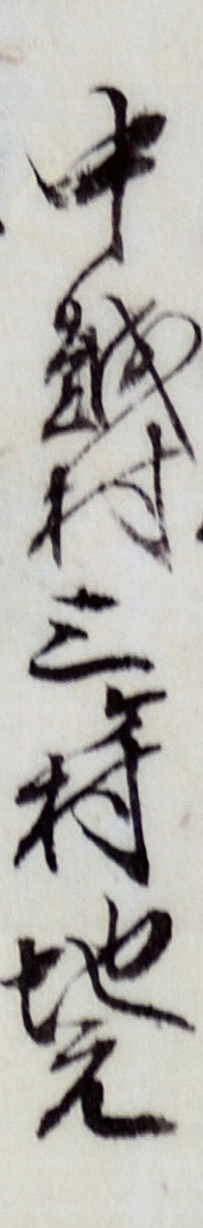中越村三ケ村地元
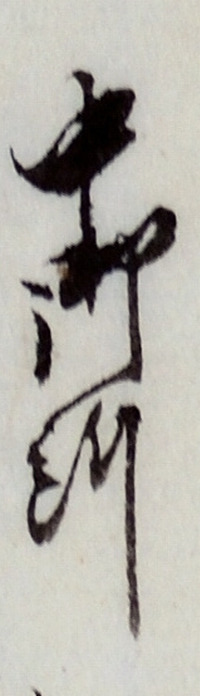中御所
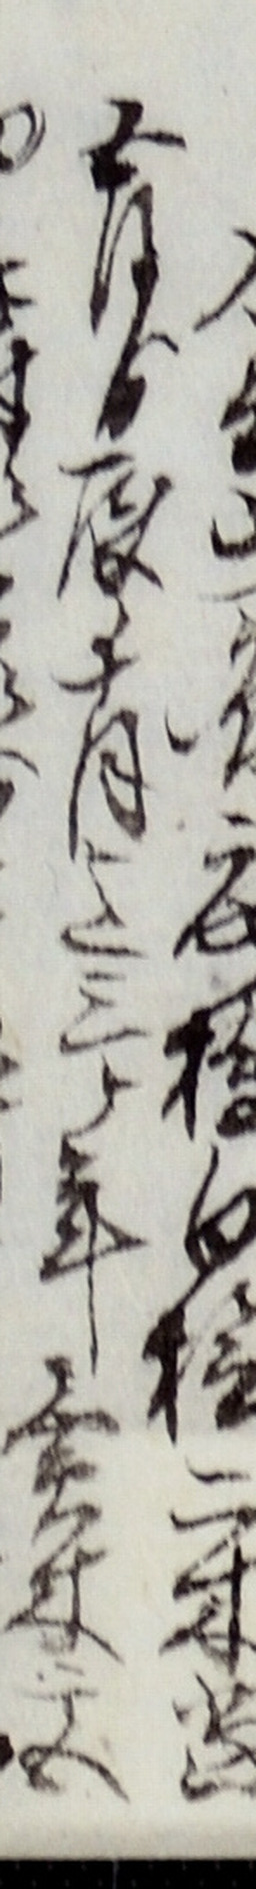五月ゟ辰ノ十月迄三ヶ年売木客
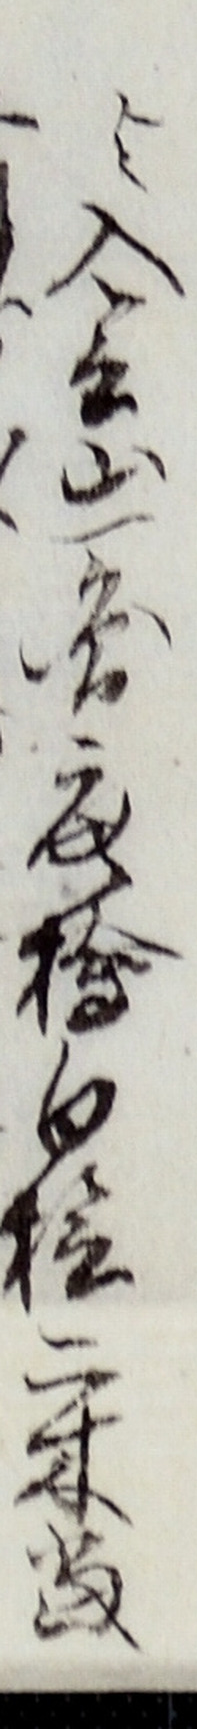と入会山一円唐桧白桧二本当
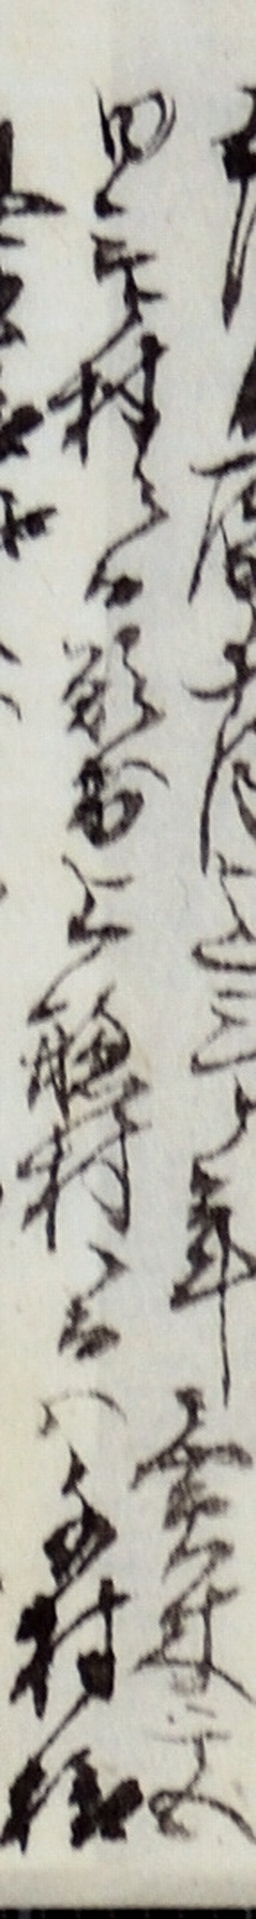日村ニ而願出上穂村ニ而は千村様
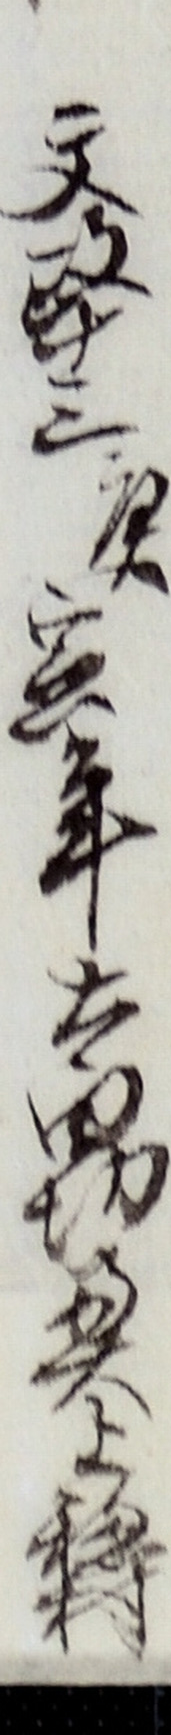文政十三庚寅年太田切奥上穂村
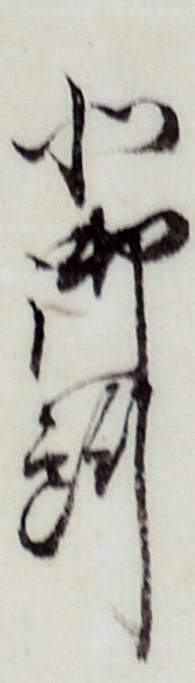北御所
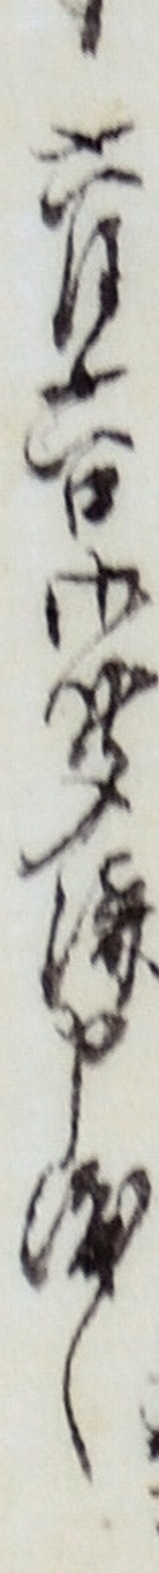六月六日御聞済申渡候
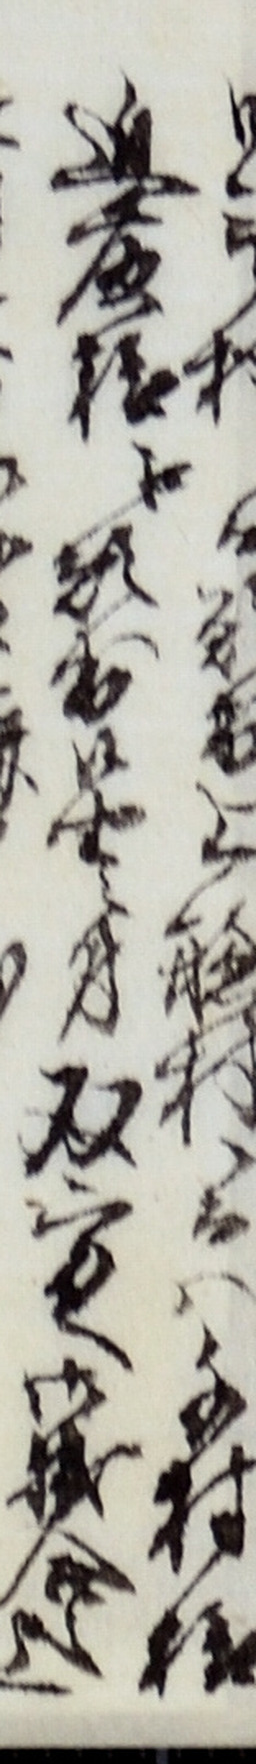近藤様え願出候由ニ付双方へ御掛合候上
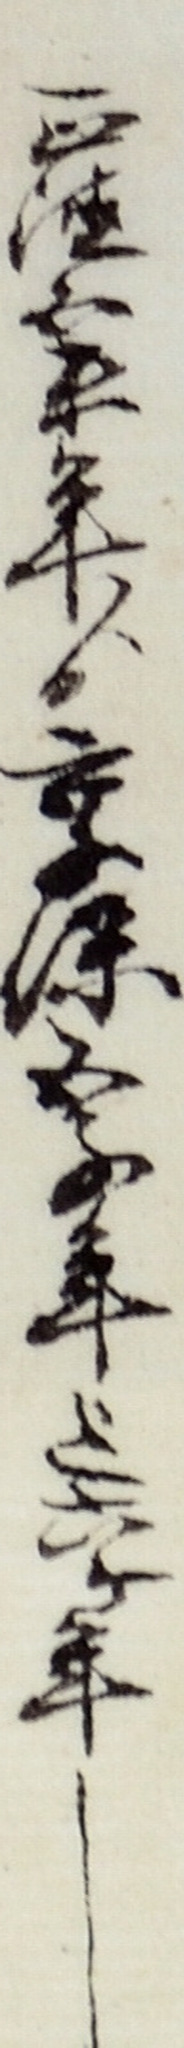正徳五未年ゟ享保五子年迄六ヶ年
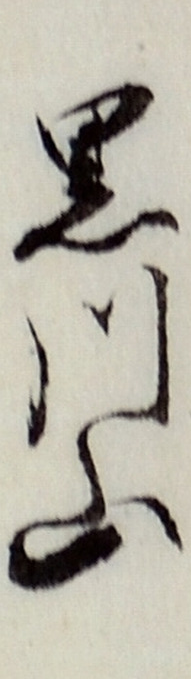黒川山

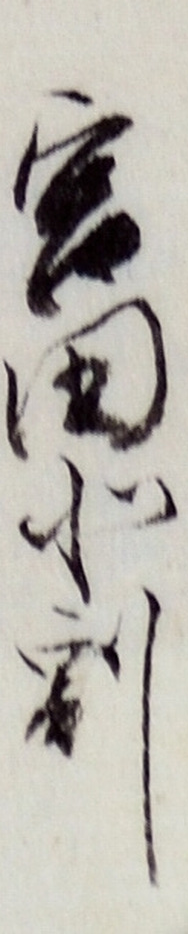宮田北割
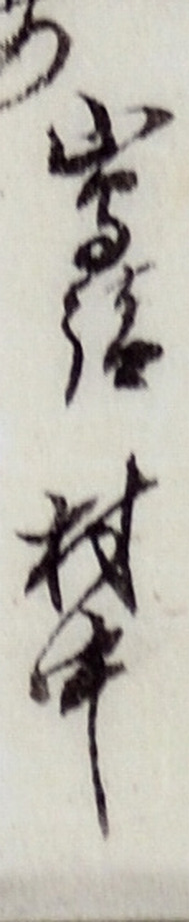山守請村中
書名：山林帳草稿
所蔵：伊那市立高遠町図書館・合同会社AMANE
